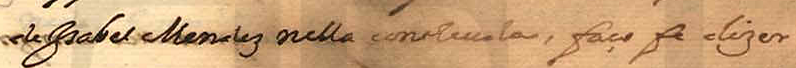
de Jsabel Mendez nella contheuda, faço fe dizer
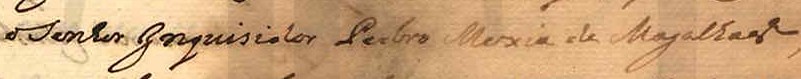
o senhor Jnquisidor Pedro Mexia de Magalhaẽs,
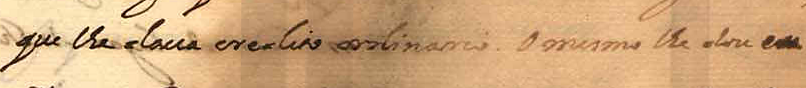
que lhe daua credito ordinario. O mesmo lhe dou eu
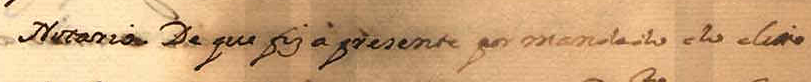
Notario. De que fiz a presente por mandado do ditto
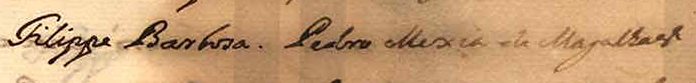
Filippe Barbosa. Pedro Mexia de Magalhaẽs
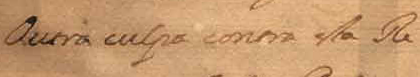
Outra culpa contra esta Re
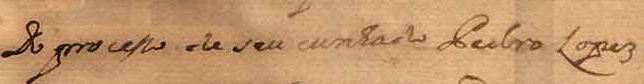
Do processo de seu cunhado Pedro Lopez
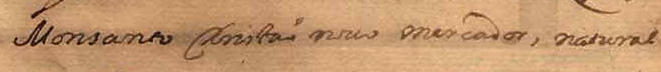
Monsanto Christaõ nouo mercador, natural
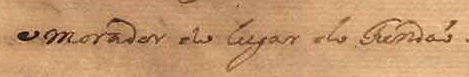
e morador do lugar do Fundaõ.
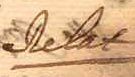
Relat
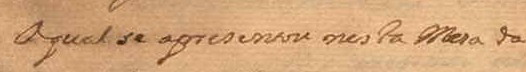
O qual se apresentou nesta mesa da
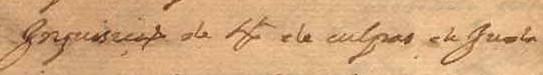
Jnquisiçaõ de Lxa de culpas de Juda
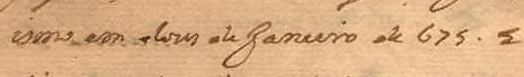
ismo em dous de Janeiro de 675. E
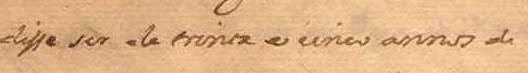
disse ser de trinta e cinco annos de
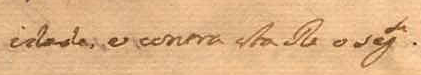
idade, e contra esta Re o segte.
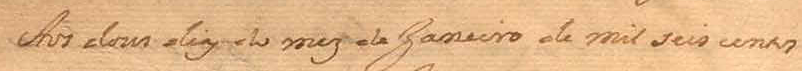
Aos dous dias do mez de Janeiro de mil seiscentos
